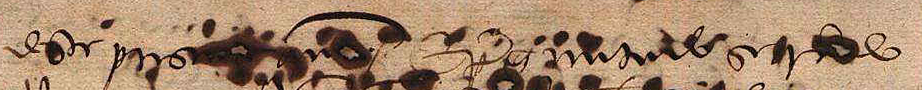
deste presente ano / E p̄gunyado se quādo
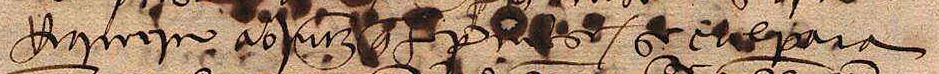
Requereo ao Juiz q̄ ho p̄ndese / se culpara
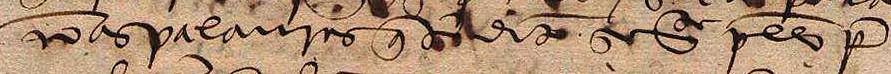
c̄o as palauras q̄ tē dito somte p̄llo p̄
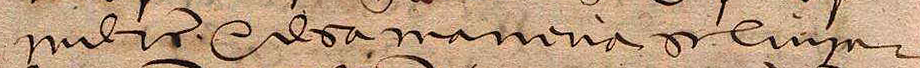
mderē e desa maneira se liurar
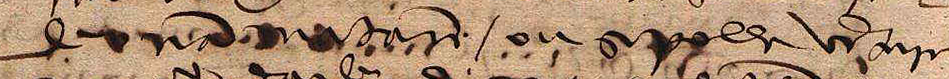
de o nā matarē / ou se polla vētura
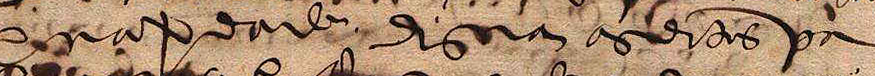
e na ꝟdade disera as ditas pa
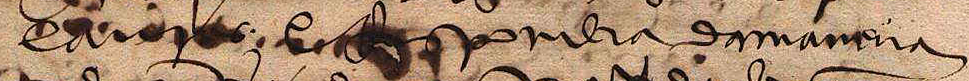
lauras e Respondera da maneira
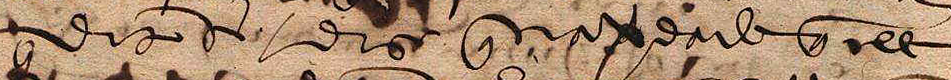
q̄ dito tē / dise q̄ era ꝟdade q̄ elle
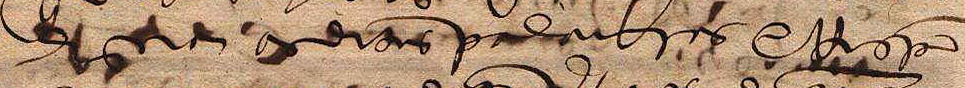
disera as ditas palauras e Respō
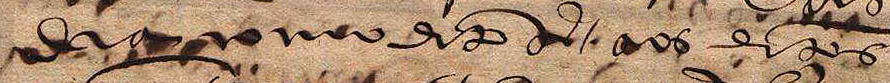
dera como dito tē / aos ditos
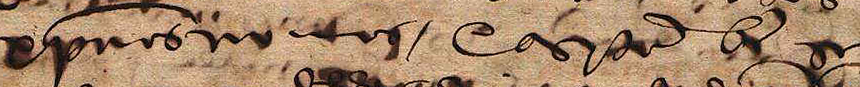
xpãos nouos / e asy tābē se
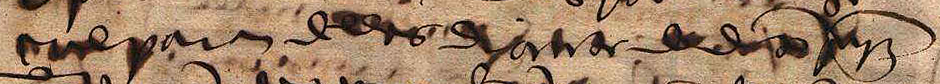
culpara dellas diante do dito Jujz
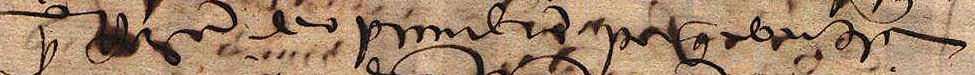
p̄o Rezā de o prenderē porq̄ doutra
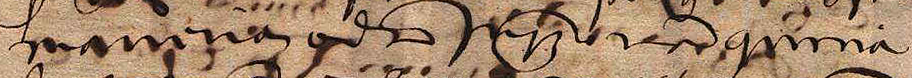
maneira o dt̄o Juiz o nā queria
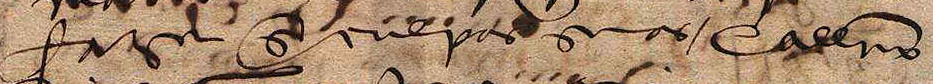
fazer sē culpas suas / e all nō
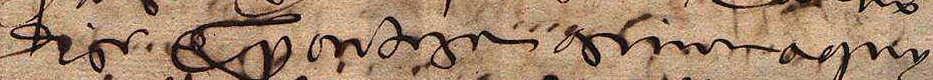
dise e p̄o certeza asinou aquy
